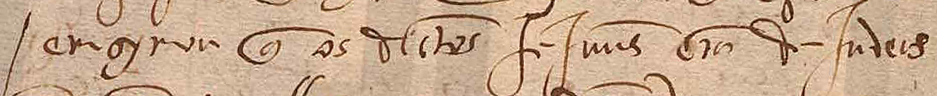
emsynou q̅ os dictos JeJūus erā de Judeus
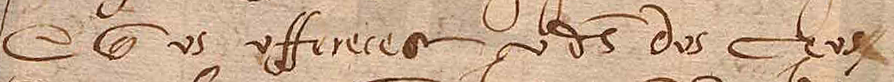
e q̄ os offerecese ao ds̄ dos Ceos/
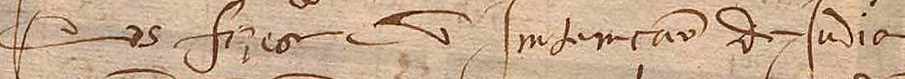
e os fizese cō Jmtemção de Judia
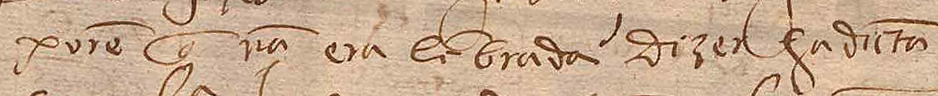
porē q̄ nā era lēbrada dizer ha dicta
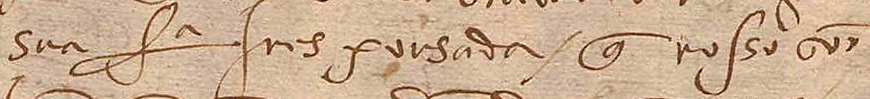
sua fa Jnes pousada / q̄ nosso sōr
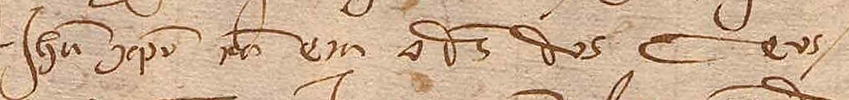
Jhū xp̄o nā era o ds̄ dos Ceos /
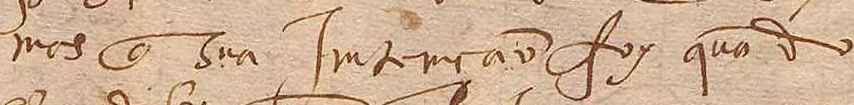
mas q̄ sua Jmtemção foy qūado
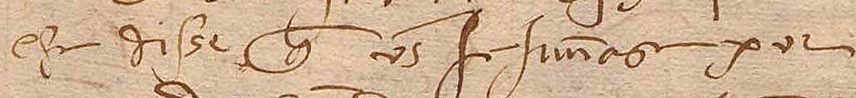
lhe disse q̄ os JeJuūase por
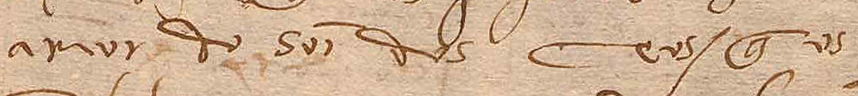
amor do sōr dos Ceos / q̄ os
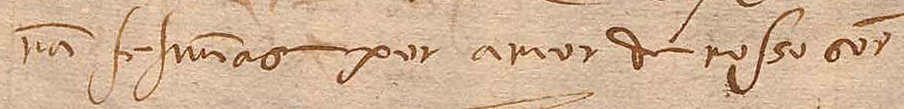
nā JeJuūase por amor de nosso sor̄
